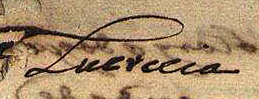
Lucrecia
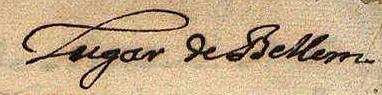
Lugar de Bellem
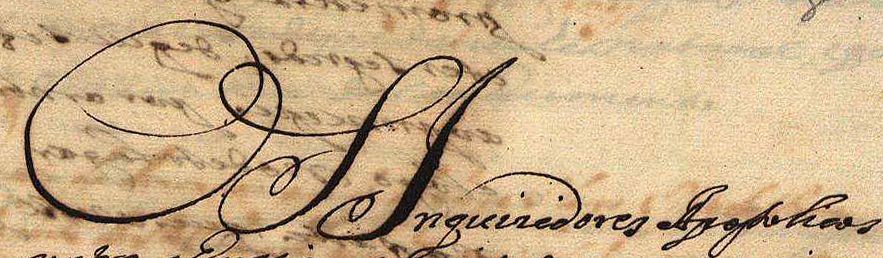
OS Inquizidores Apostolicos
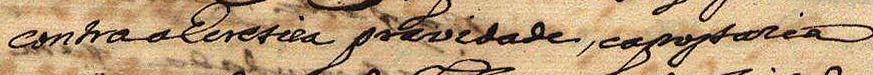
contra a heretica pravidade, e apostazia
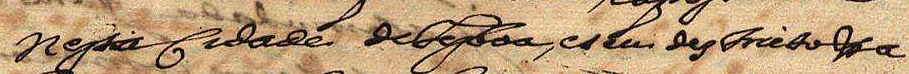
nesta Cidade de Lisboa, e seu destricto &a
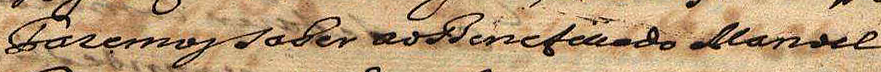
Fazemos saber ao Beneficiado Manoel
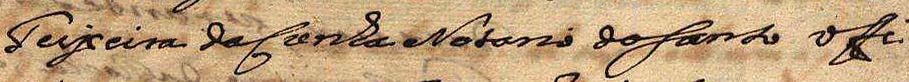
Teyxeira da Cunha Notario do santo offi
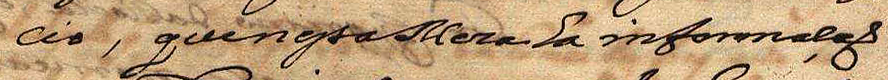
cio, que nesta Meza ha informaçaõ
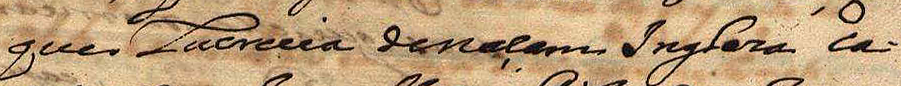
que Lucrecia de naçam Ingleza ca
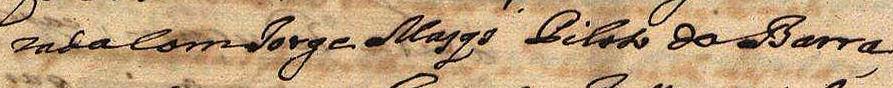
zada com Iorge Masqs Piloto da Barra
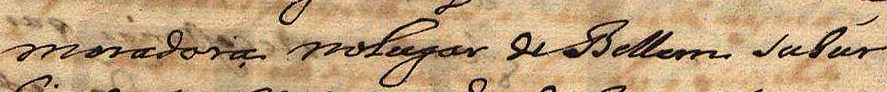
moradora no Lugar de Bellem subur
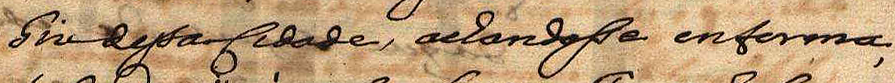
bio desta Cidade, achandosse enferma,
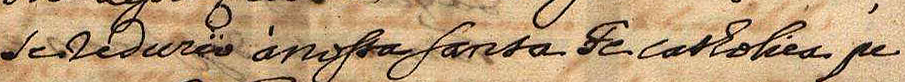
se Reduzio a nossa santa Fe catholica pe
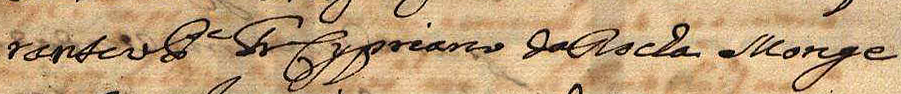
rante o Pe Fr Cypriano da Rocha Monge
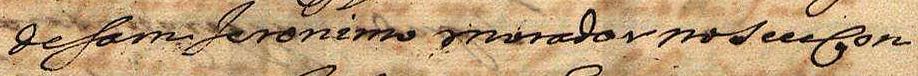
de sam Jeronimo morador no seu Con
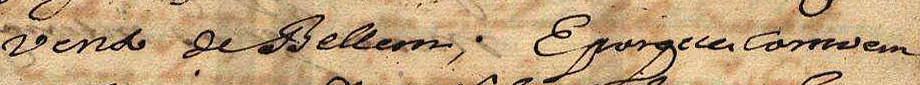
vento de Bellem; E porque comvem
